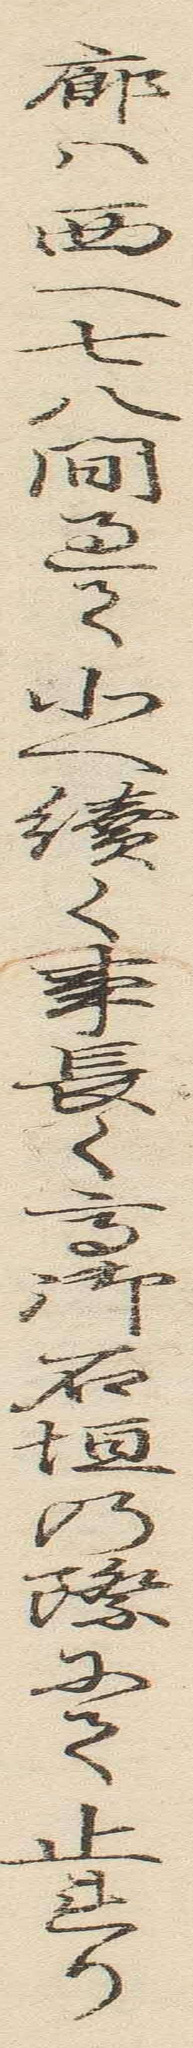廊は西へ七八間過て北へ續く事長く高御石垣の際にて止れり
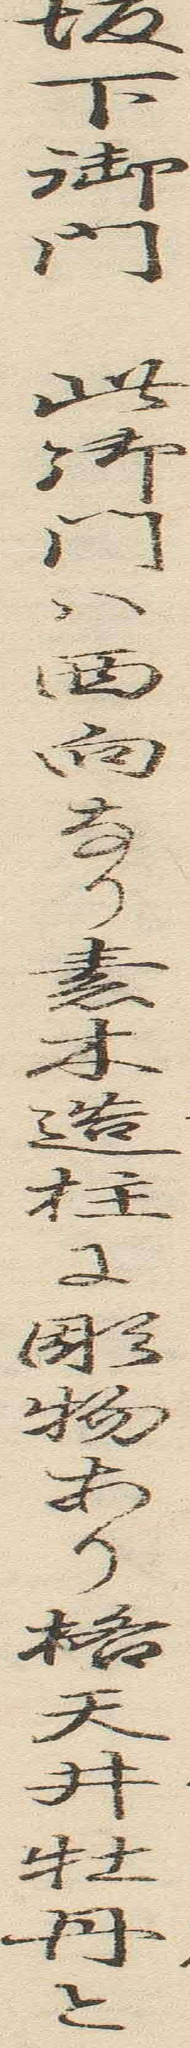坂下御門此御門は西向なり素木造柱に彫物あり格天井牡丹と
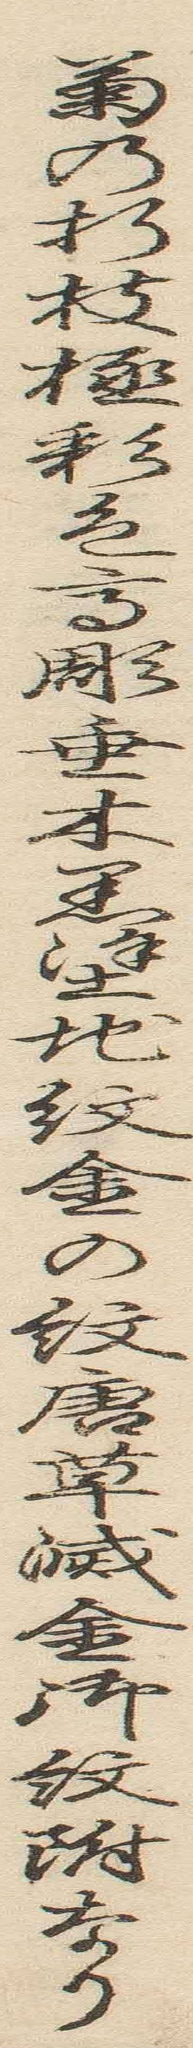菊の折枝極彩色高彫垂木黒塗地紋金の紋唐草滅金御門附なり
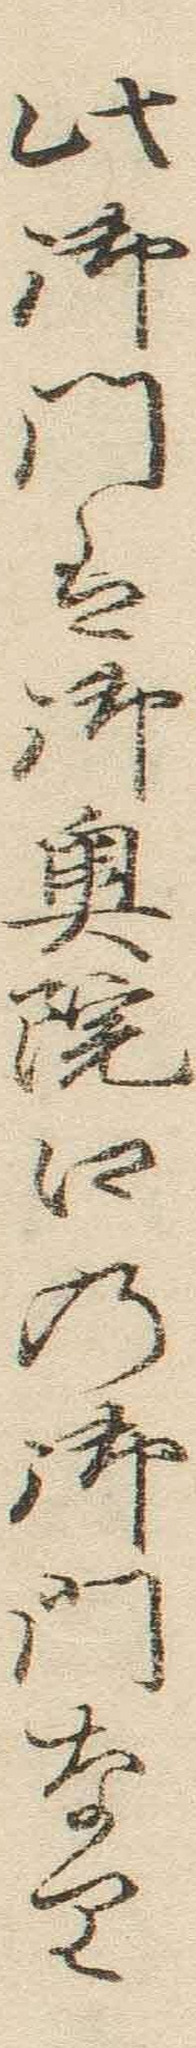此御門は御奥院口の御門なり
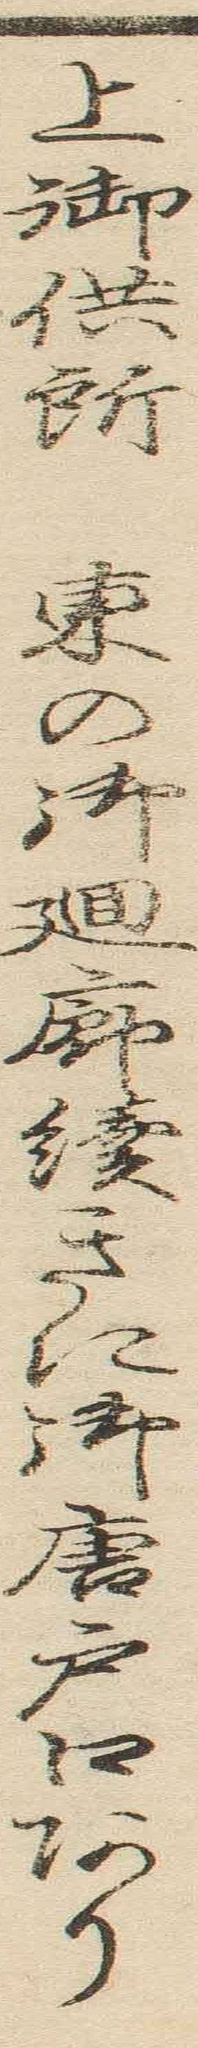上御供所東の御廽廊續きに御唐戸口あり
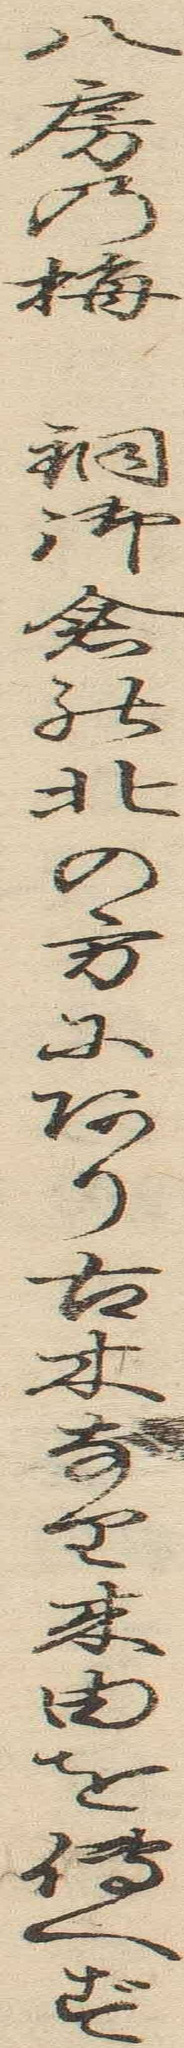八房の梅銅御倉の北の方にあり古木なり來由を傳へず

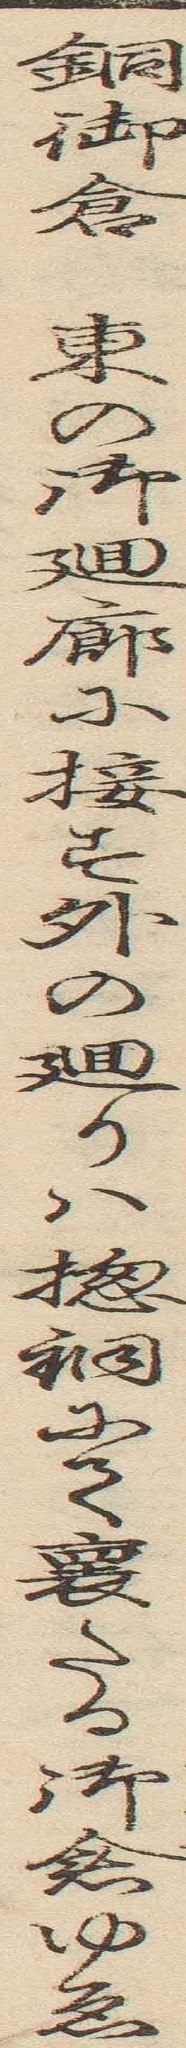銅御倉東の御廽廊に接す外の廽りは揔銅にて褱たる御倉ゆゑ
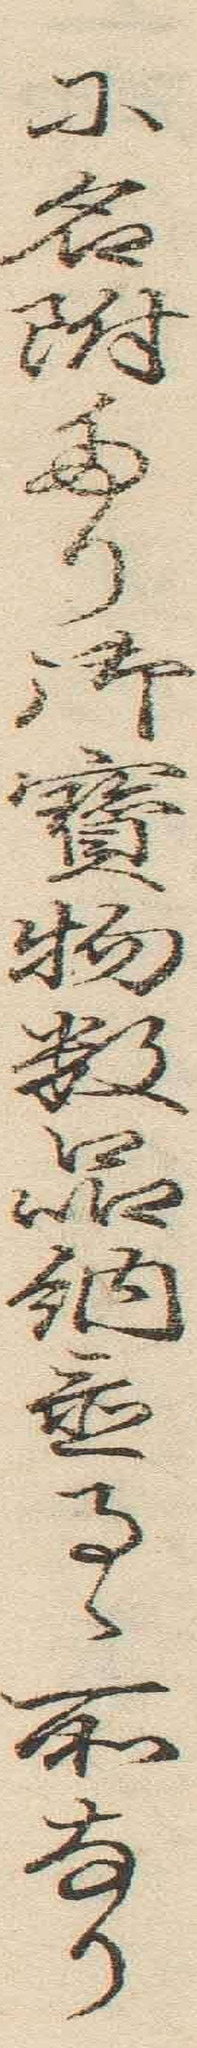に名附たり御寶物数品納置るゝ所なり
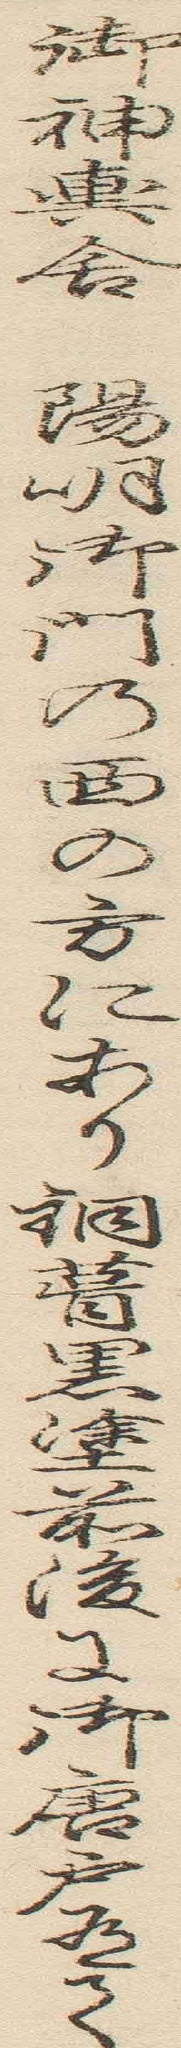御神輿舍陽明御門の西の方にあり銅葺黒塗前後に御唐戸有て
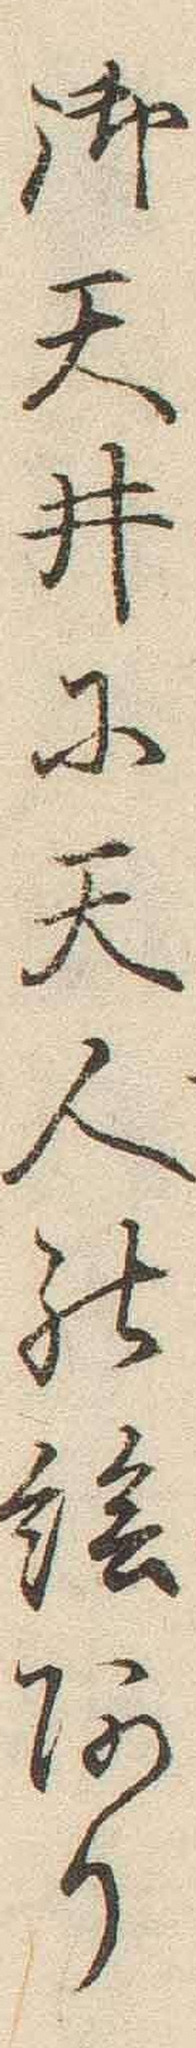御天井に天人の絵あり
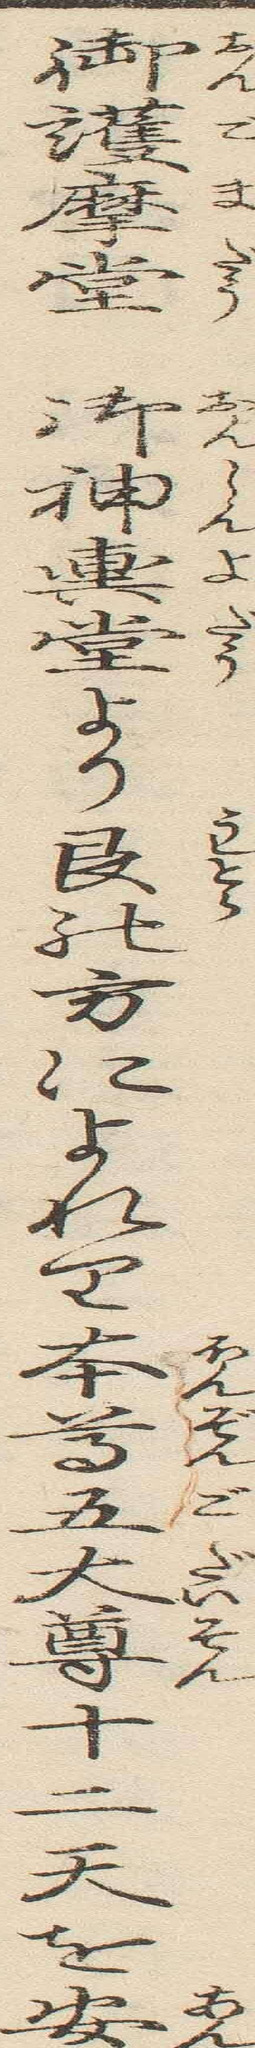御護摩堂御神輿堂より艮の方によれり本尊五大尊十二天を安
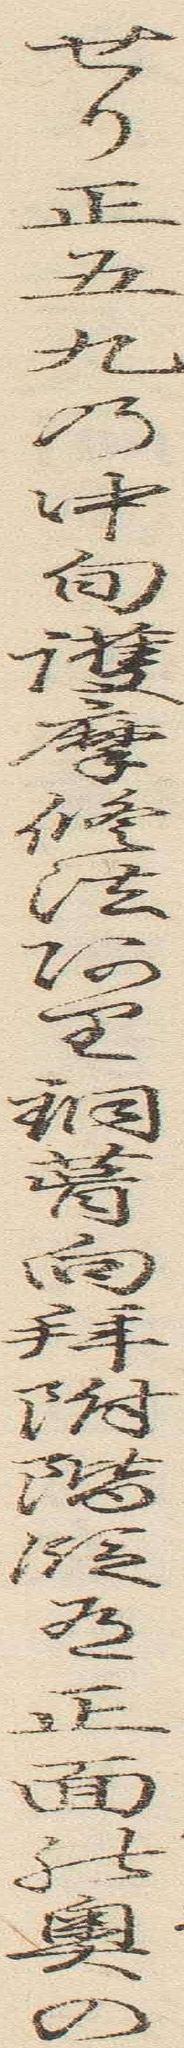せり正五九の中旬護摩修法あり銅葺向拜附階段有正面の奥の
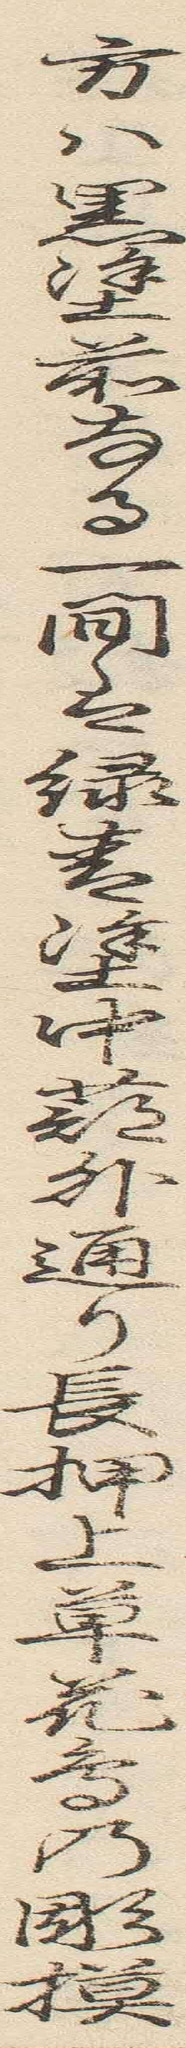方は黒塗前なる一間は緑青塗中蔀外通り長押上草花鳥の彫摸
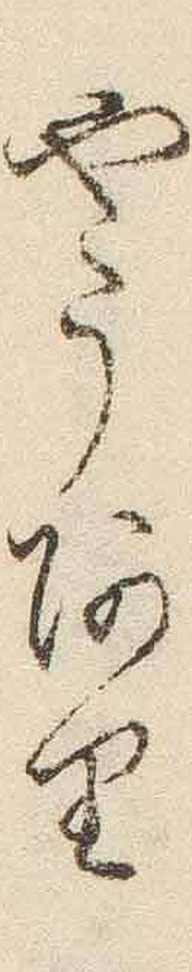やうあり
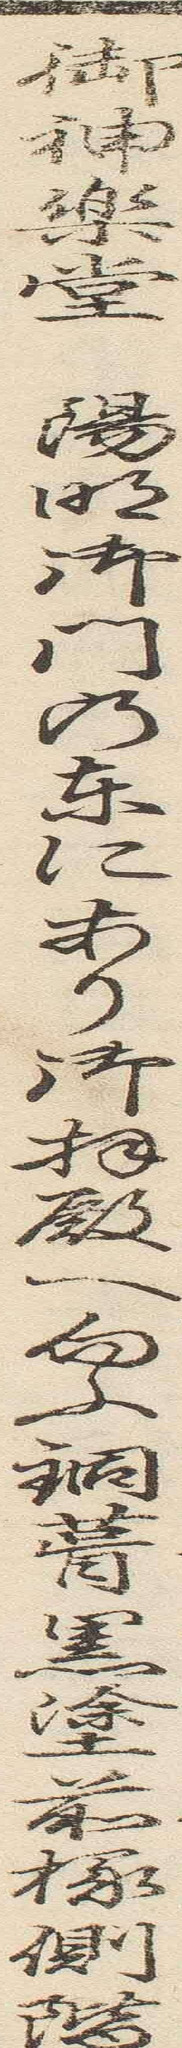御神樂堂陽明御門の東にあり御拝殿へ向ふ銅葺黒塗前椽側階
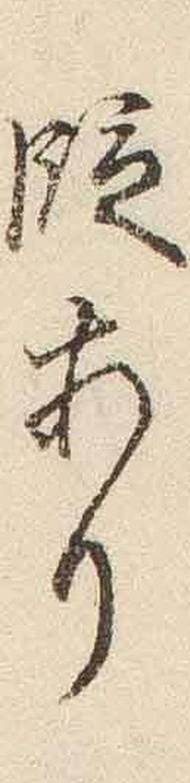段あり
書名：日光山志
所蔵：東京学芸大学附属図書館 国文学研究資料館
